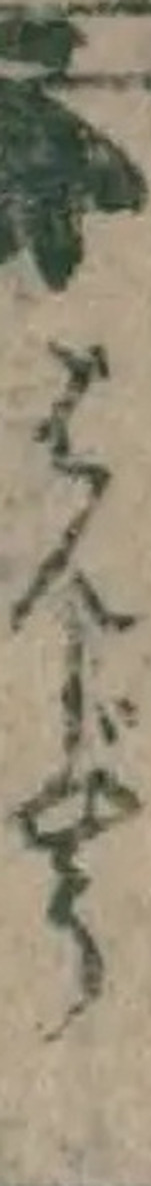はんじやう
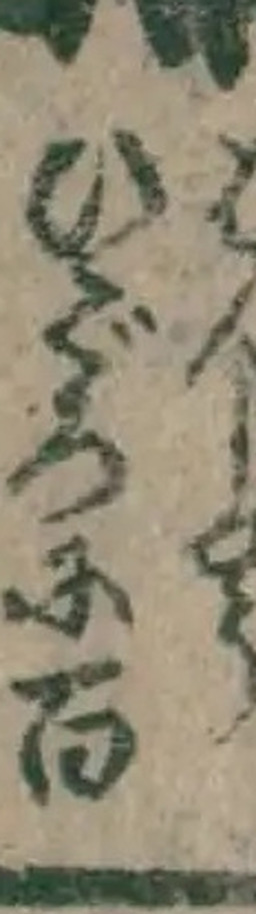ひごろに百
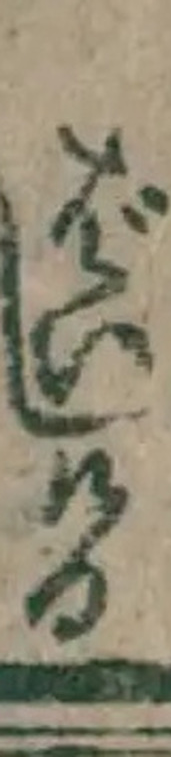ばいしける
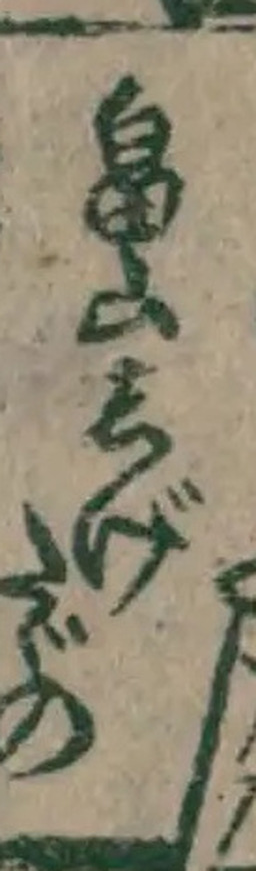畠山しげただの
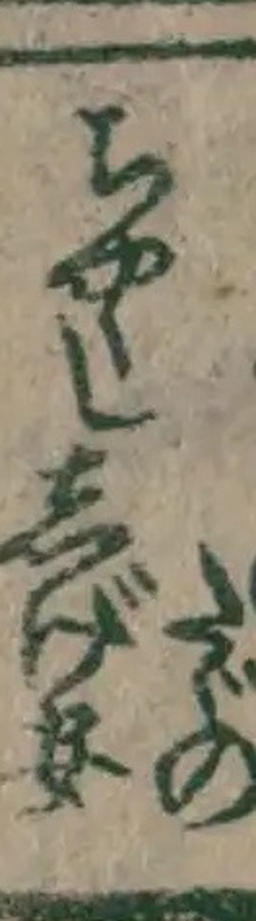ちやくししげ安
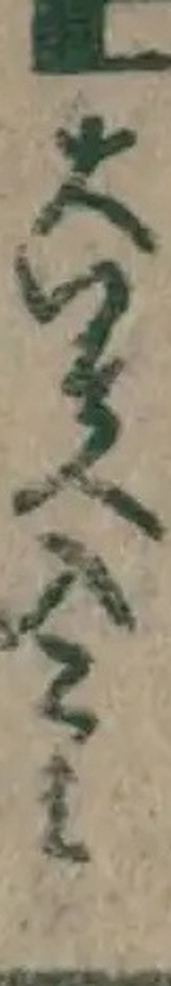大いそへ入こみ
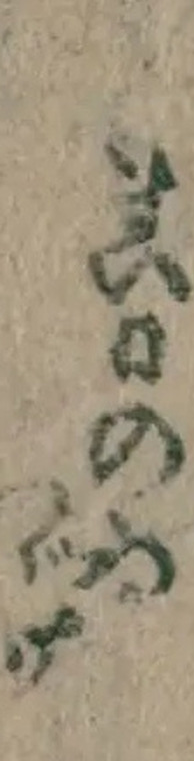まい日のゐ
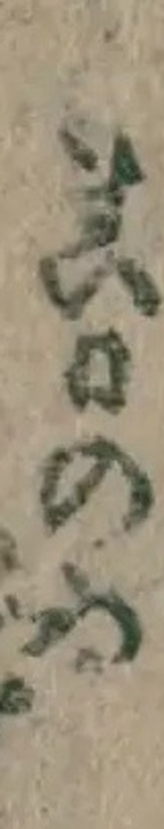まい日のゐ
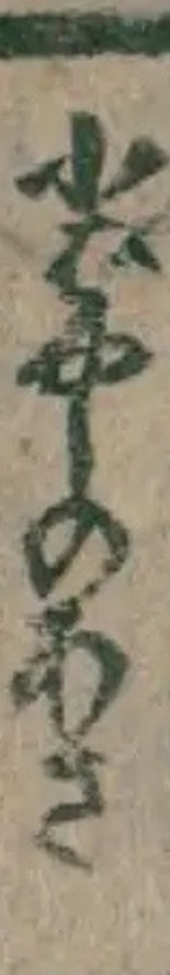小ばやしのあさ
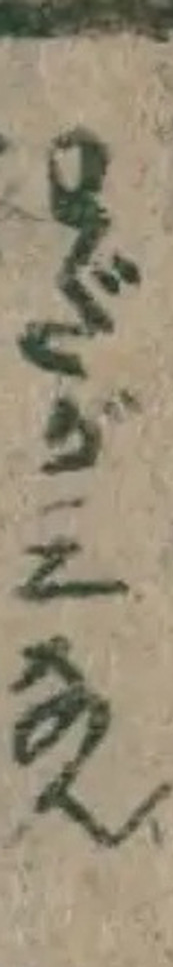わだが三なん
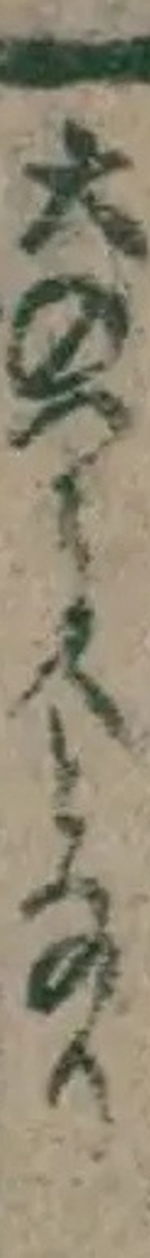大のつらかへとなり
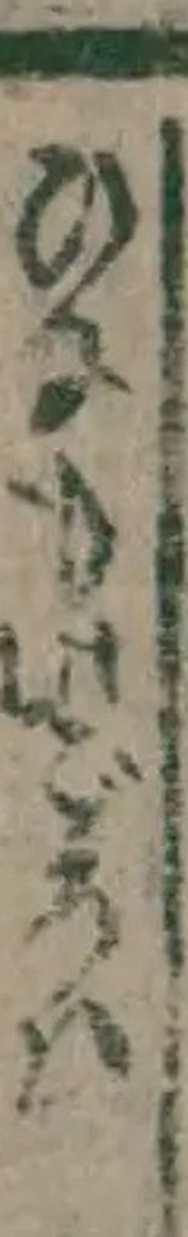ひなも此ごろは
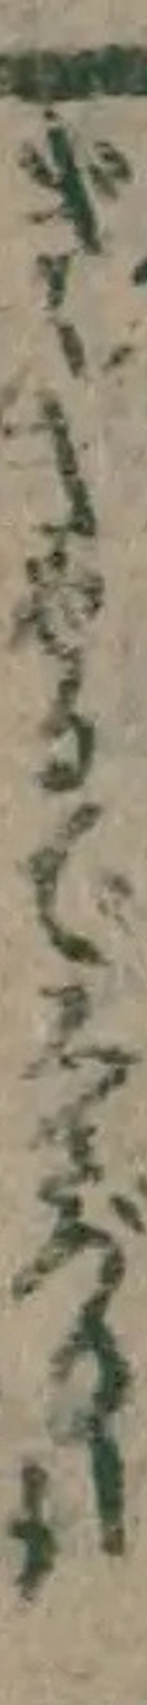ぎんきせるでくさづり引
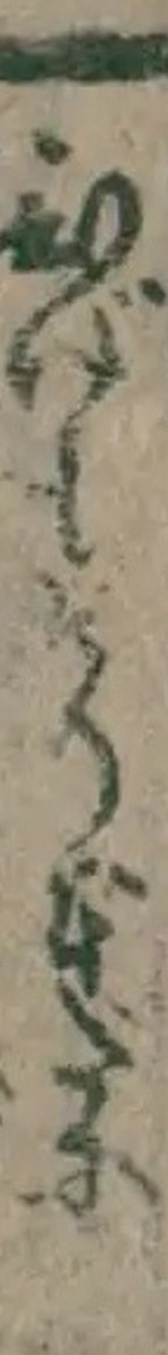ひげもそり本だに
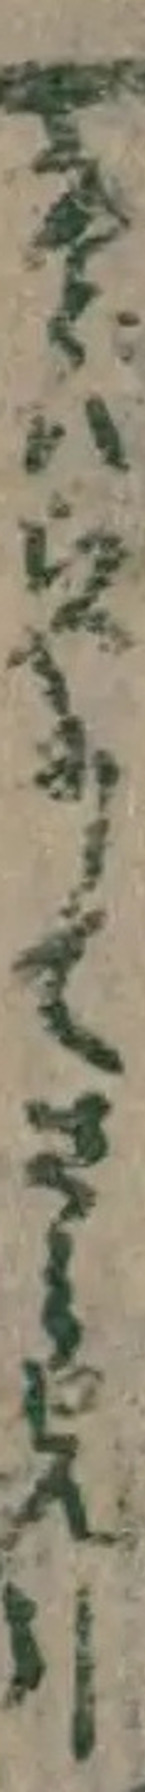などはいやみてさみせん引
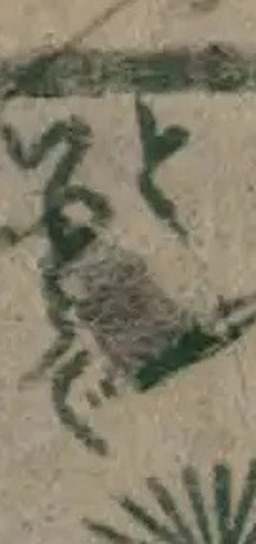いやみで
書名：頓作時雨月 3巻
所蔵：国立国会図書館 National Diet Library, JAPAN
